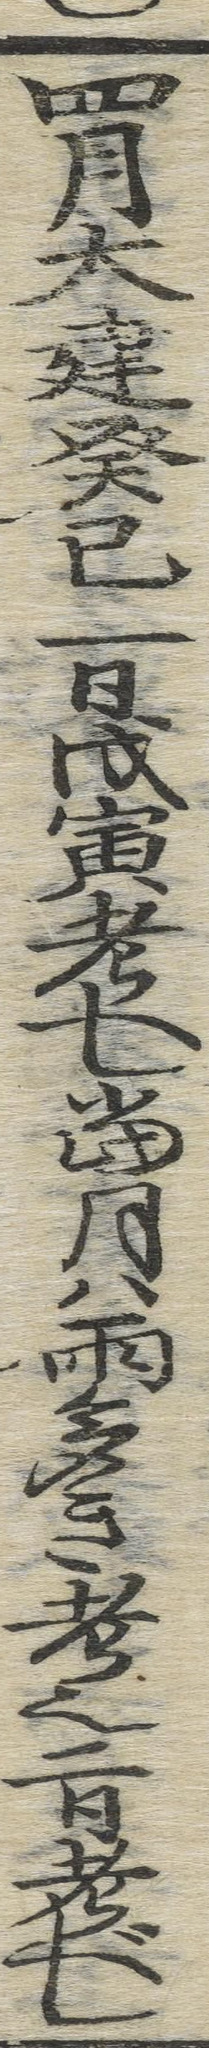四月大建癸已一日戊寅考へし当月は雨多き考也二日考べし
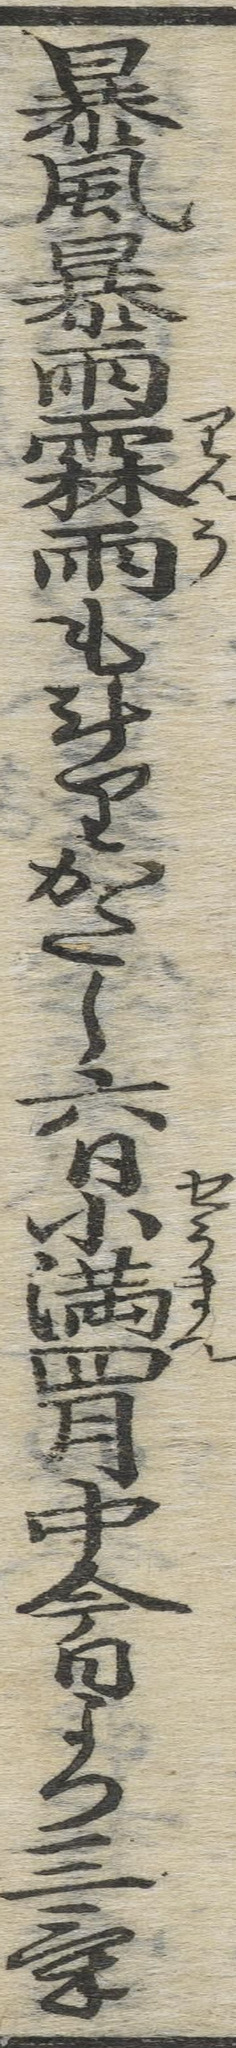暴風暴雨霖雨も斗りかたし六日小満四月中今日より三気
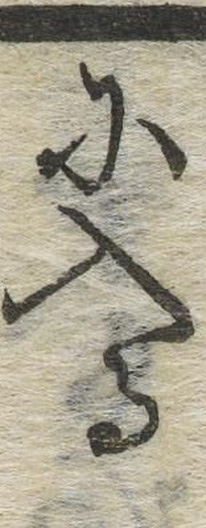に入る
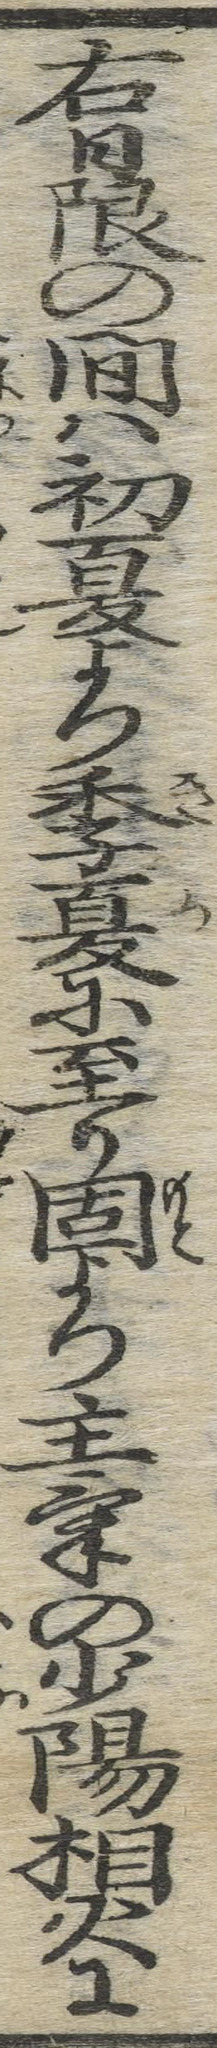右日限の間は初夏より季夏に至り固より主気の少陽相火に
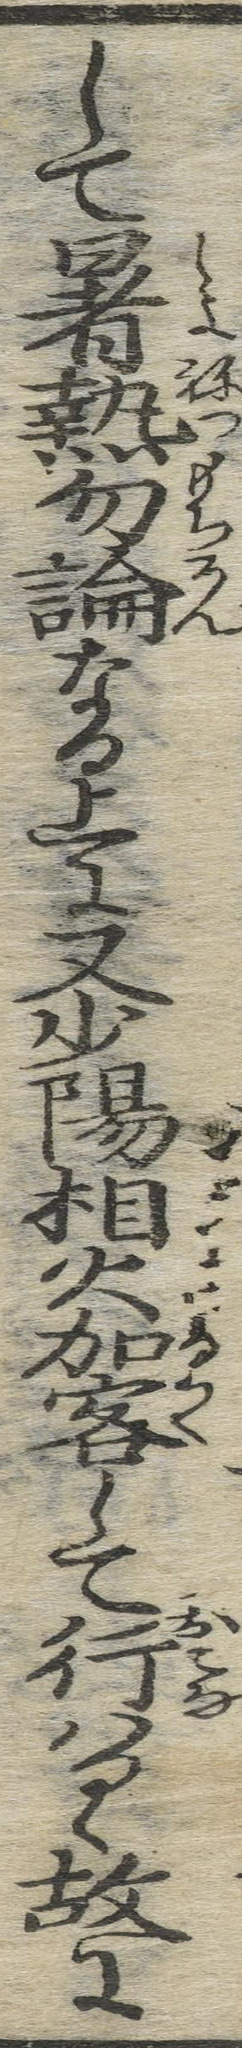して暑熱勿論なる上に又少陽相火加客して行はるゝ故に

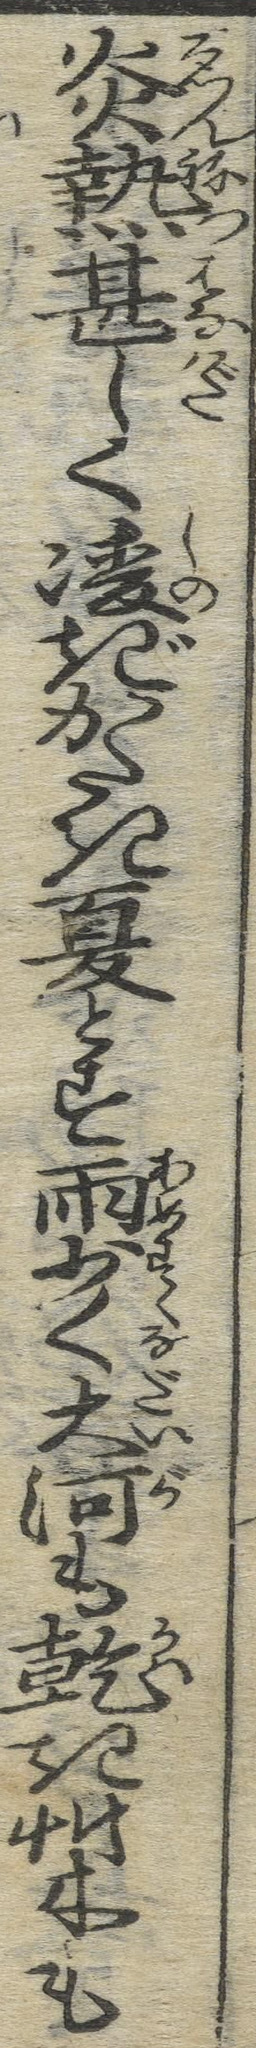炎熱甚しく凌ぎかたき夏とす雨少く大河も乾き艸木も
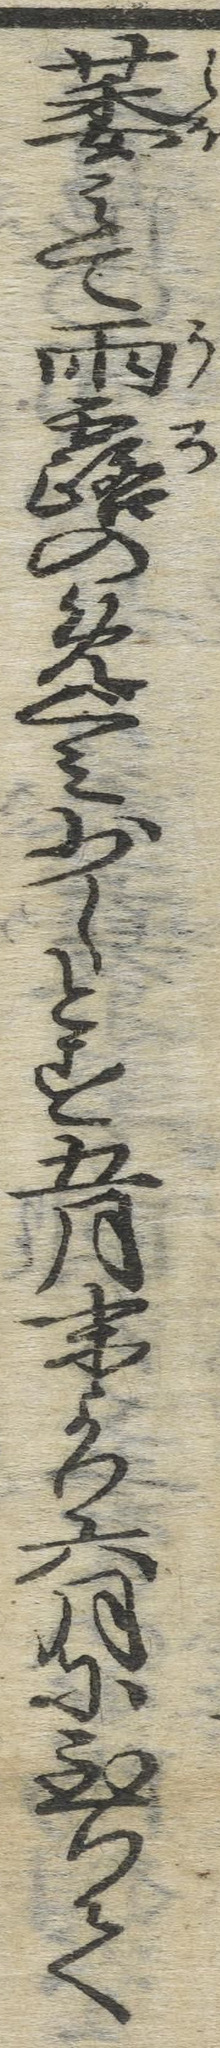萎えて雨露のめぐみ少しとす五月事より六月に至りて
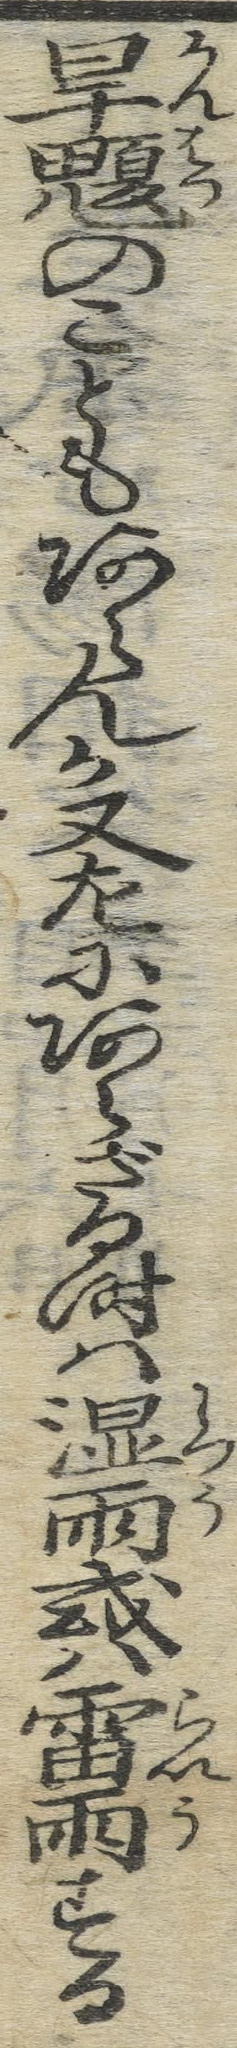旱魃のこともあらんか又左にあらざる時は湿雨或は雷雨する
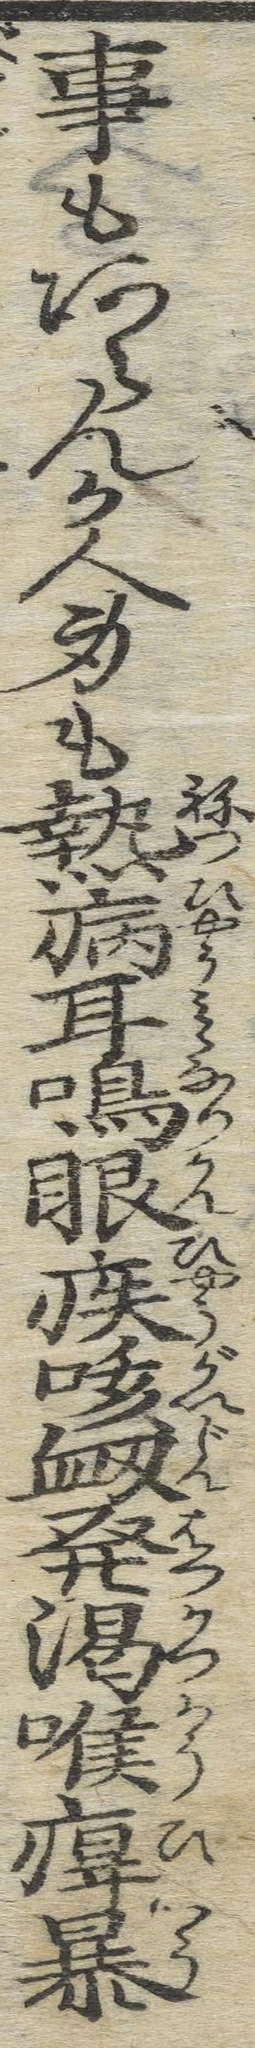事もあらんか人身も熱病耳鳴眼疾咳衂発渇喉痺暴
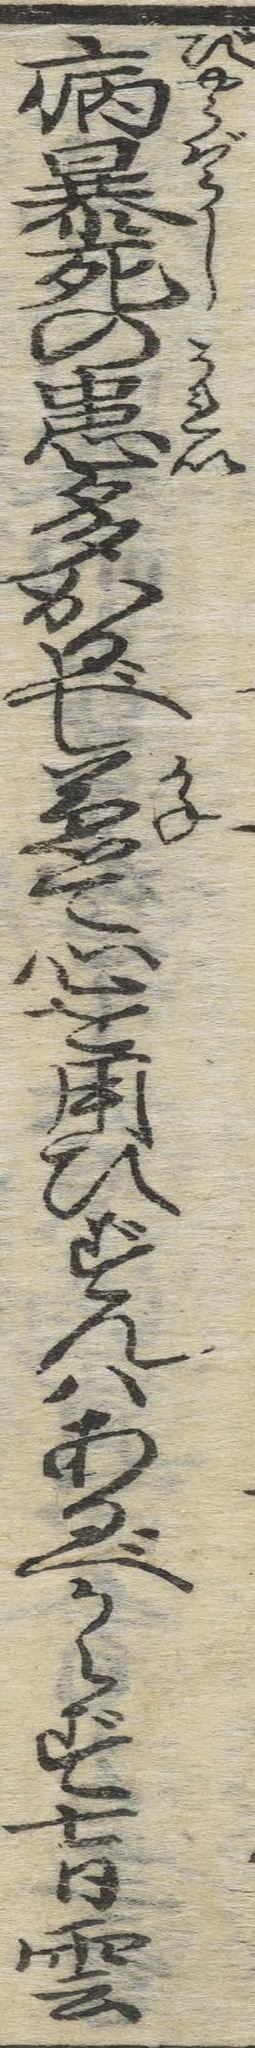病暴死の患多かるべし兼て心を用ひずんはあるべからず七日雲
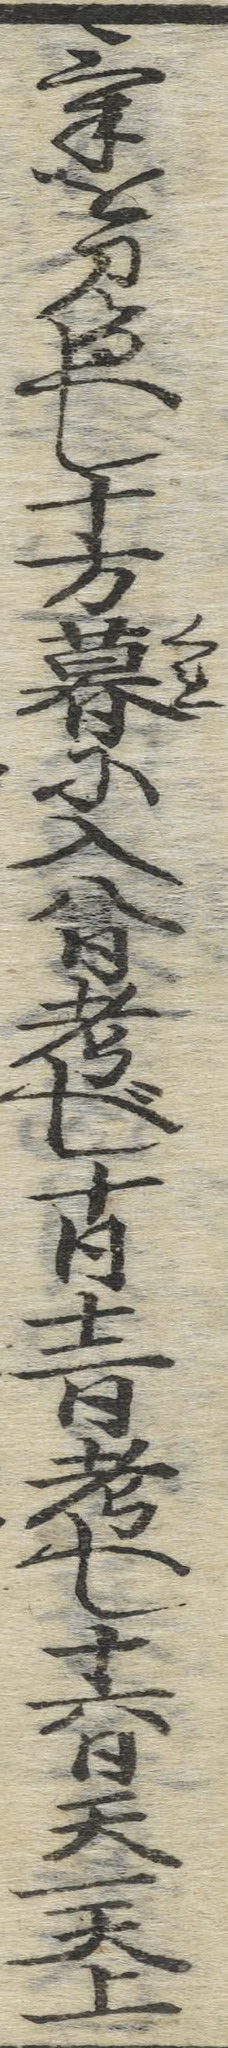気を見るへし十方暮に入八日考べし十日十二日考へし十六日天一天上
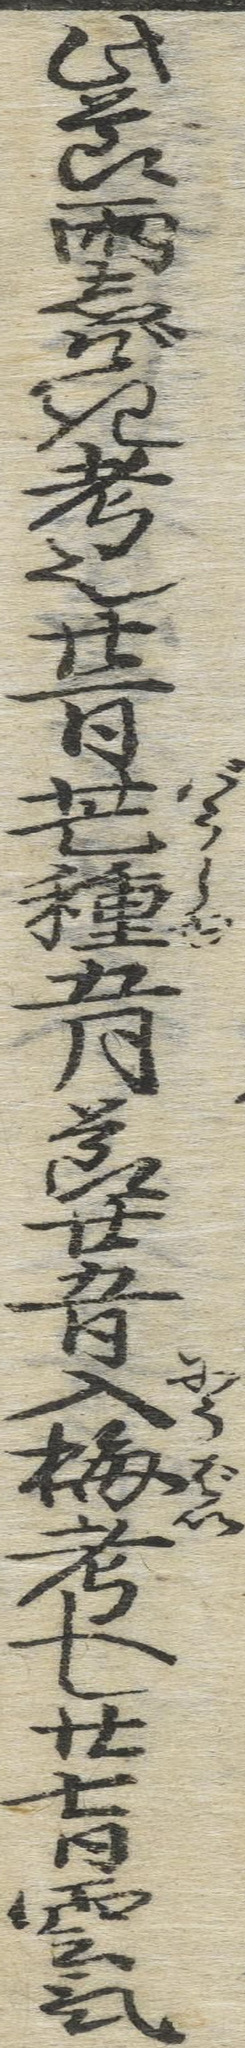此節雨しげき考也廿一日芒種五月節廿五日入梅考へし廿七日雲気
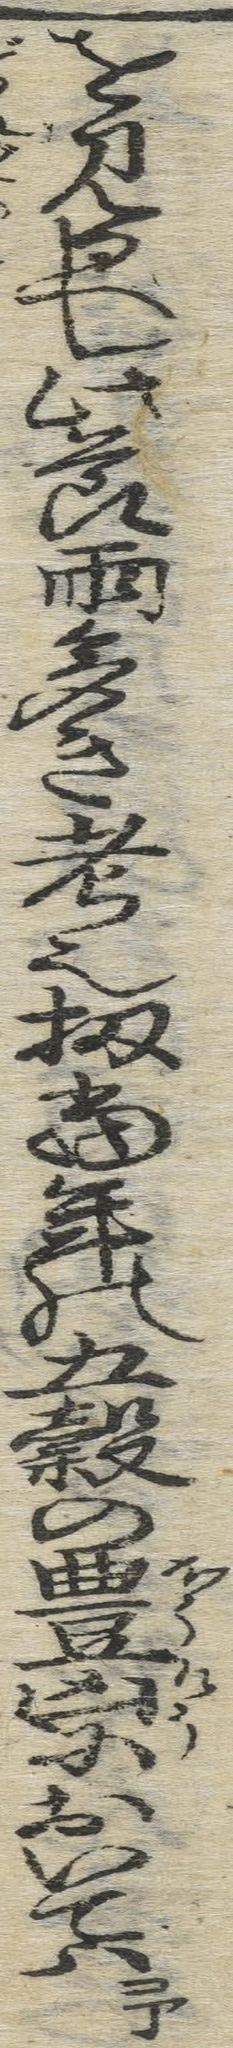を見るへし此節雨多き考也扨当年の五穀の豊凶においては予
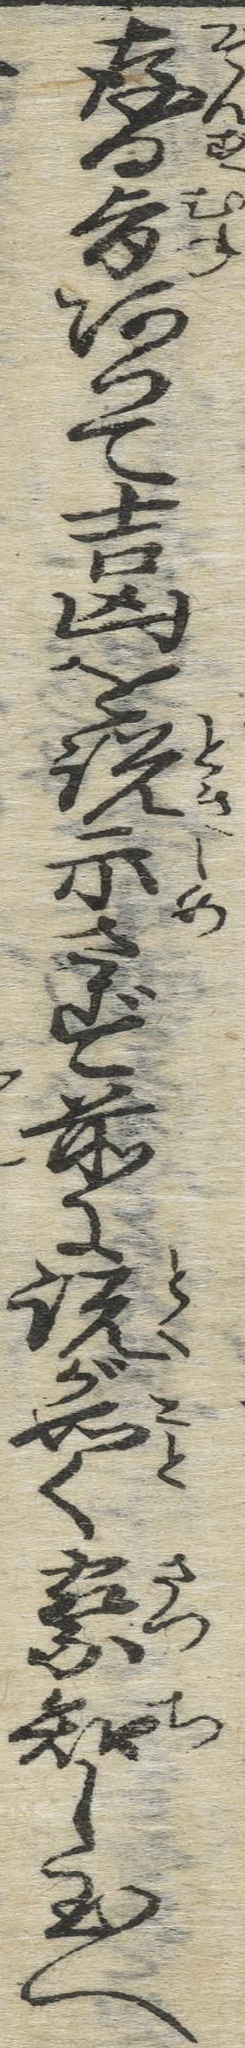存る旨ありて吉凶を説示さず前に説が如く察知し玉へ
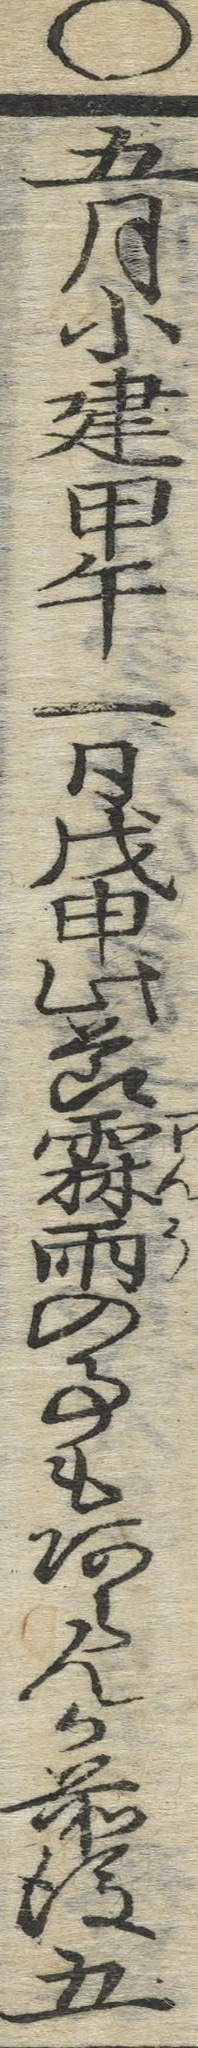五月小建甲午一日戊申此節霖雨の事もあらんか前後五
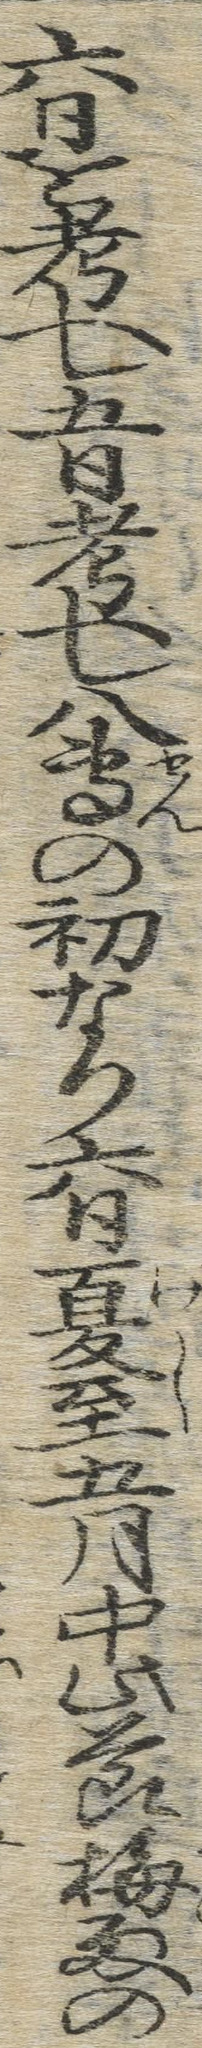六日を考へし五日考へし八専の初なり六日夏至五月中此節梅雨の
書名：[晴雨考]
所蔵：東京大学地震研究所図書室 Earthquake Research Institute Library, The University of Tokyo, JAPAN
